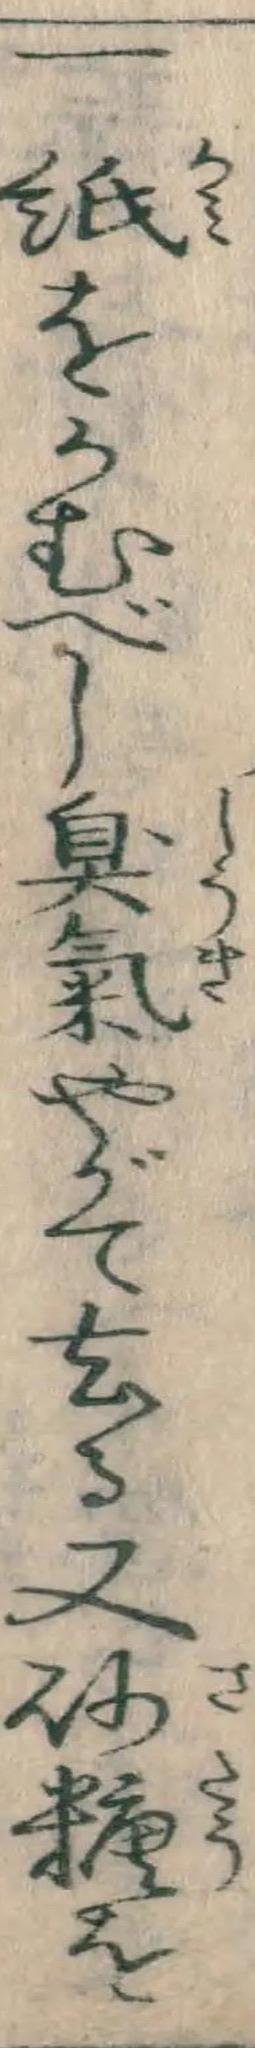一紙をかむべし臭気やがて去る又砂糖を
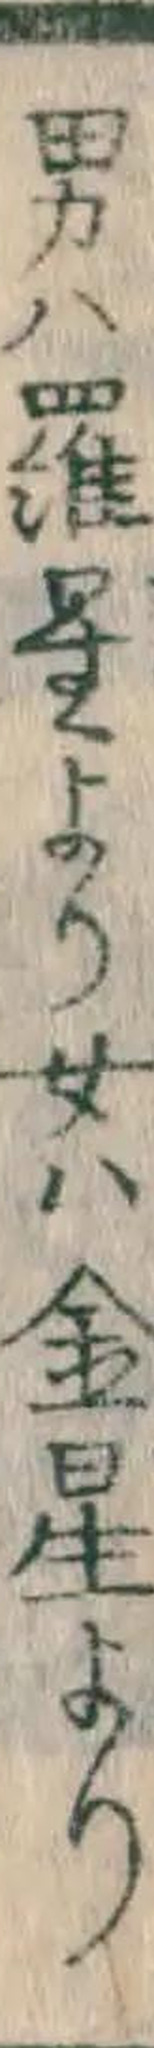男は羅星より女は金星より
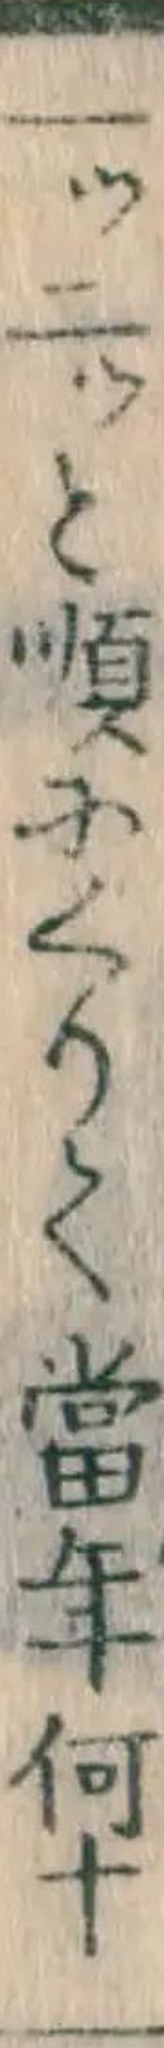一ッ二ッと順にくりて当年何十
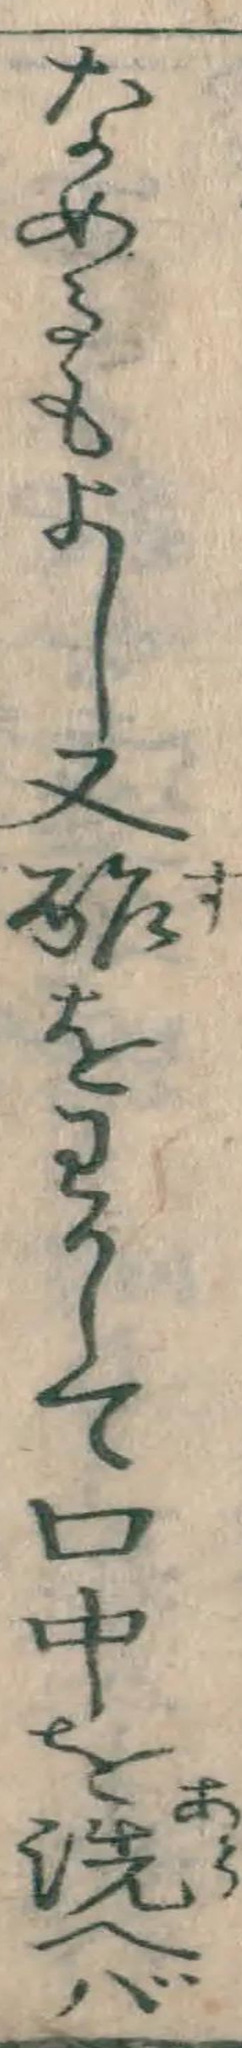なめるもよし又酢をわかして口中を洗へば
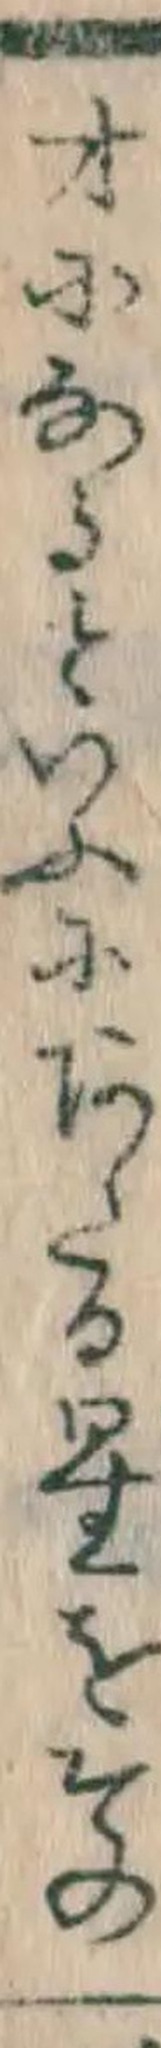才になるといふにあたる星をその
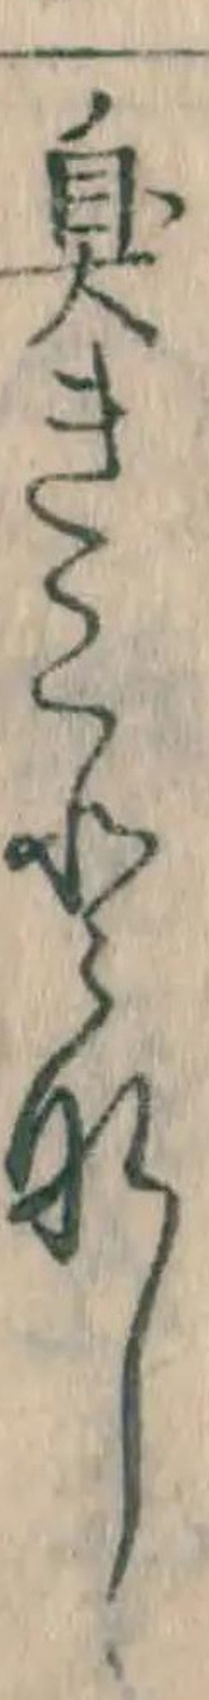臭きことなし

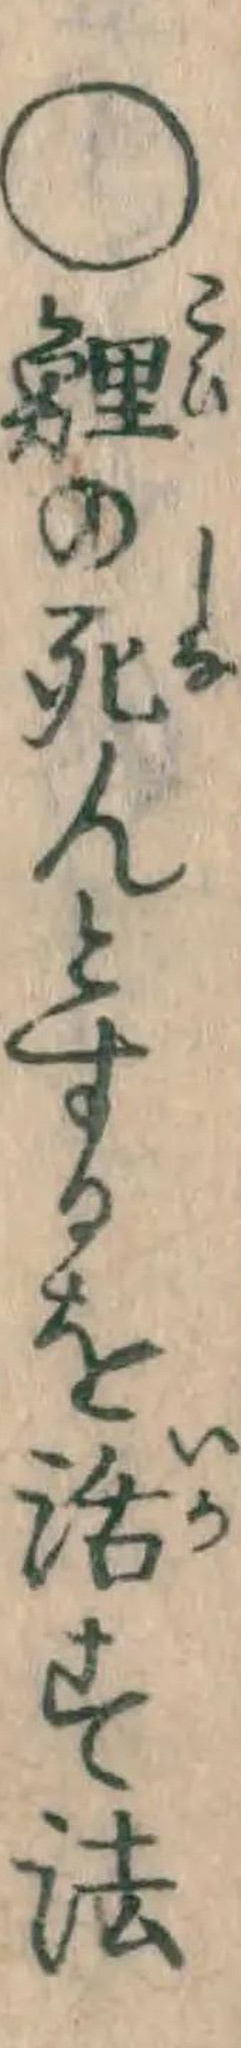○鯉の死んとするを活す法
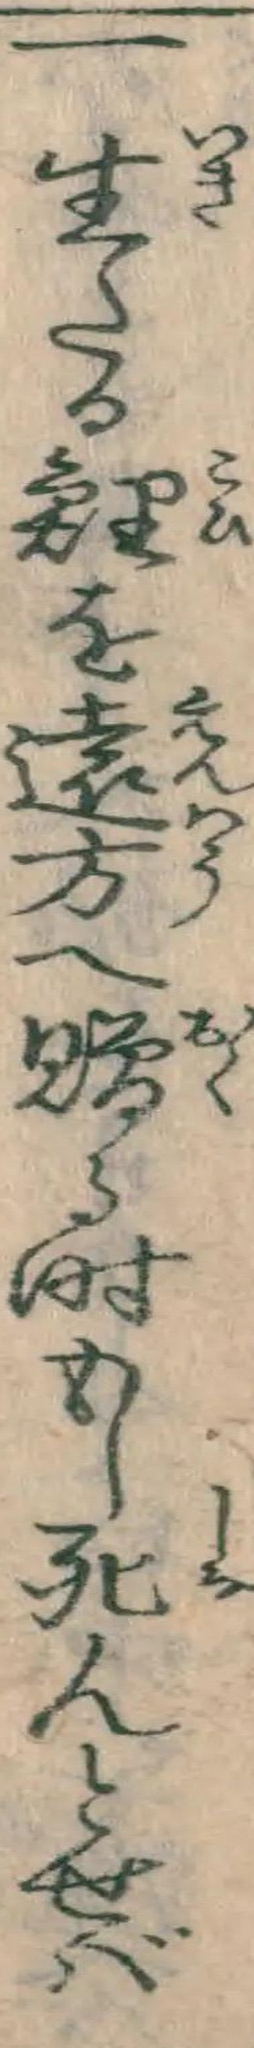一生たる鯉を遠方へ贈る時もし死んとせば
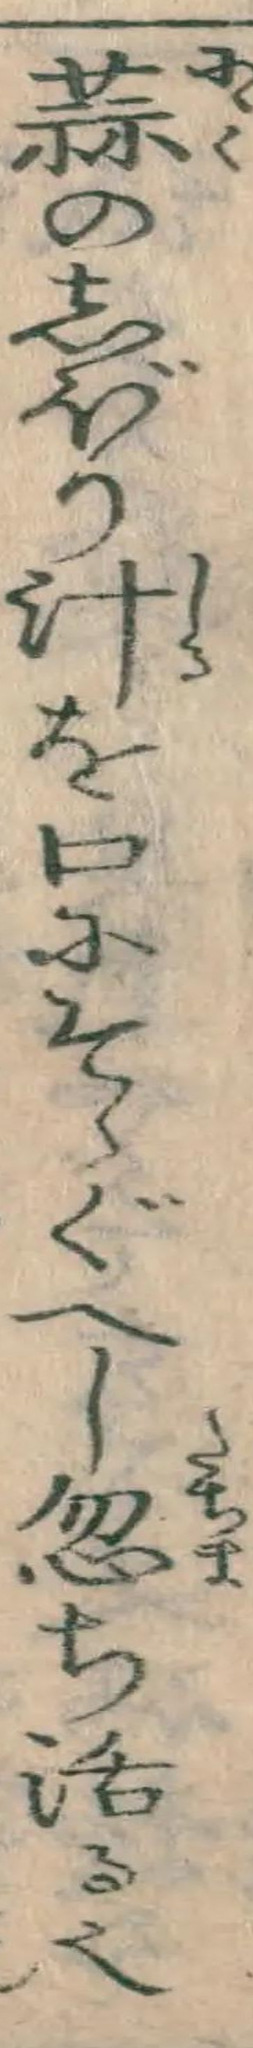蒜のしぼり汁を口にそゝぐへし忽ち活る也
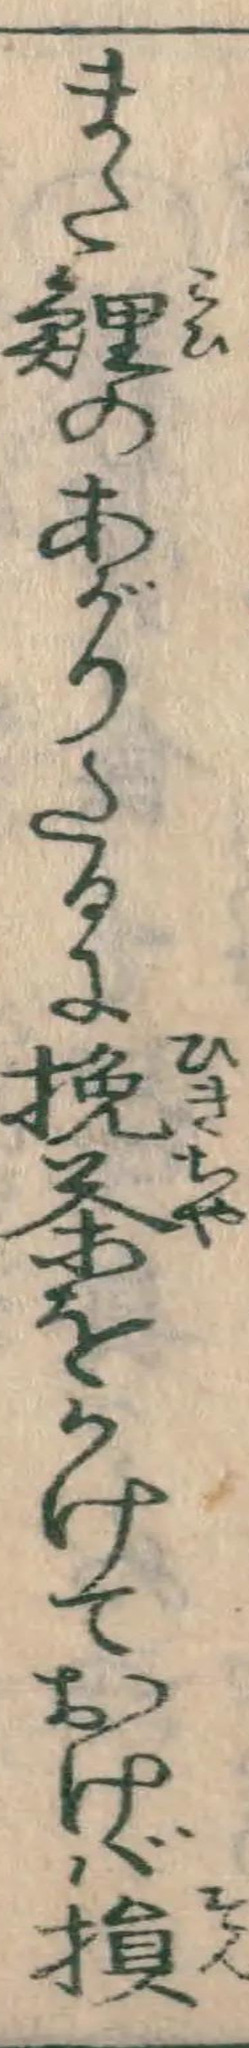また鯉のあがりたるに挽茶をかけておけば損
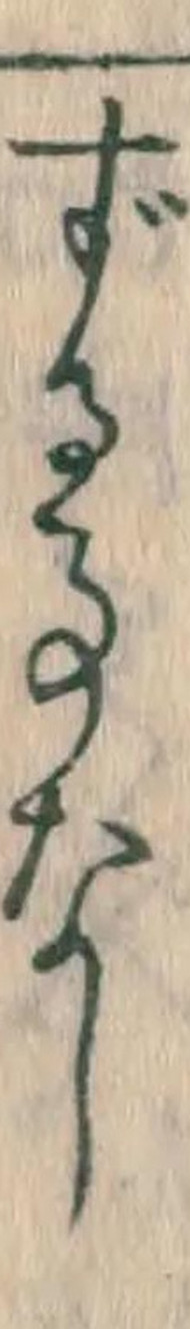ずる事なし
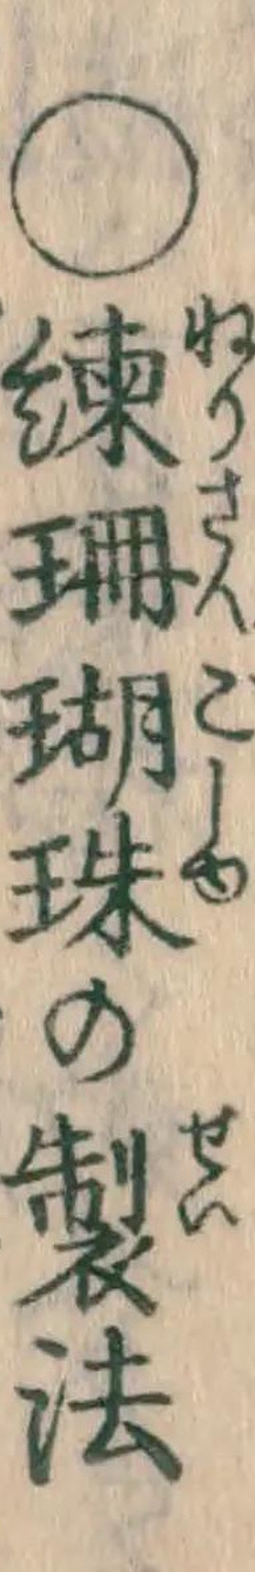○練珊瑚珠の製法
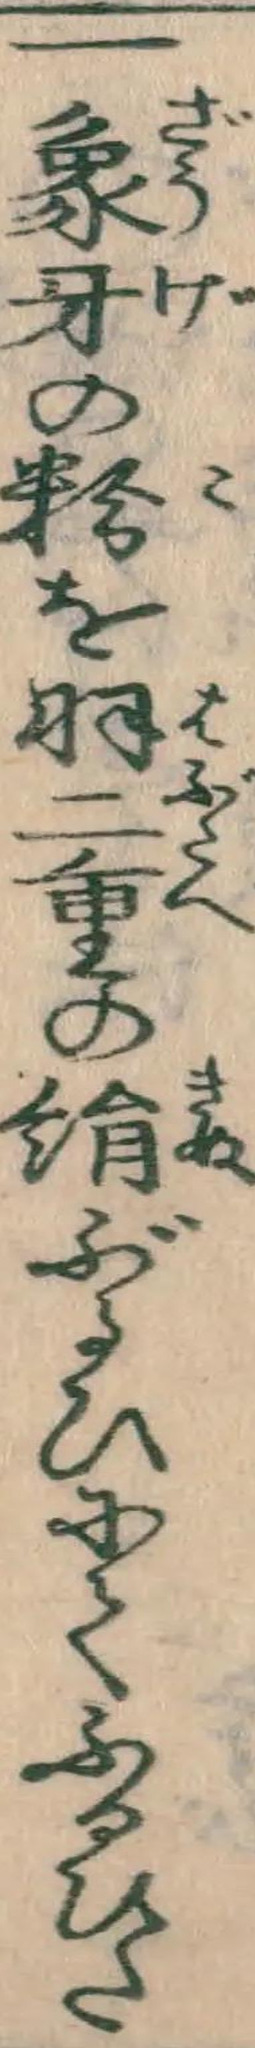一象牙の粉を羽二重の絹ぶるひにてふるひた
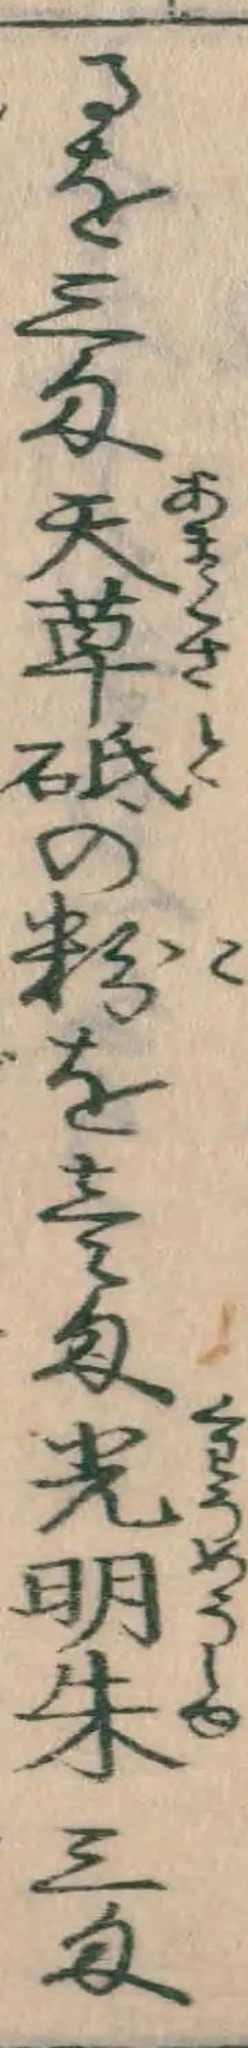るを三匁天草砥の粉を壱匁光明朱三匁
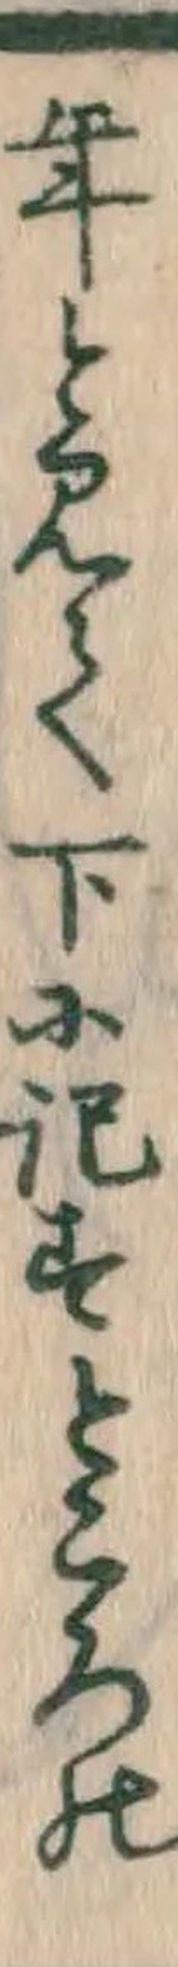年と見て下に記すところの
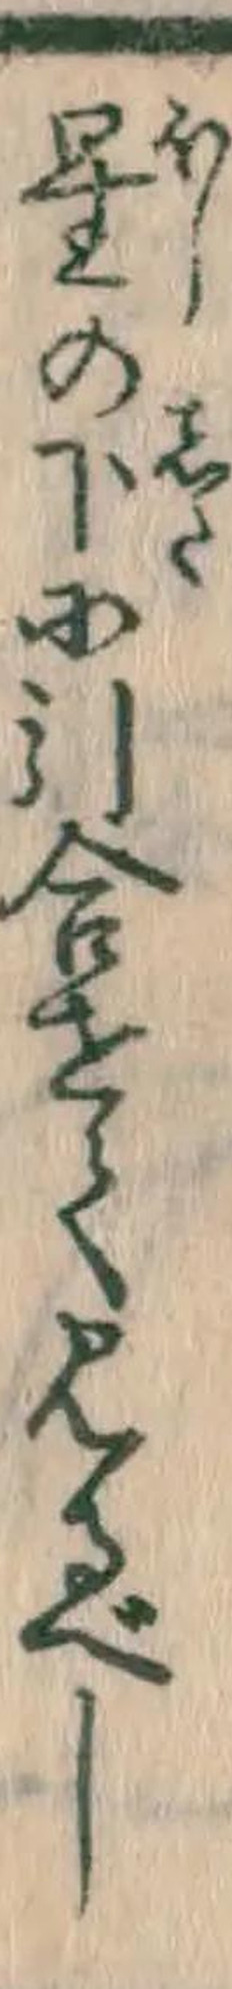星の下に引合せて見るべし
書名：広益秘事大全 3巻. [1]
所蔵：国立国会図書館 National Diet Library, JAPAN
